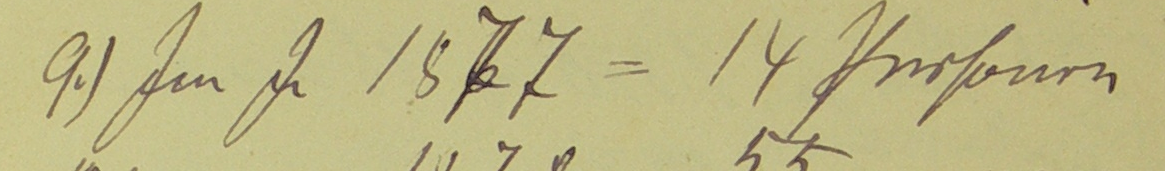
9) * 1877 = 14 Personen
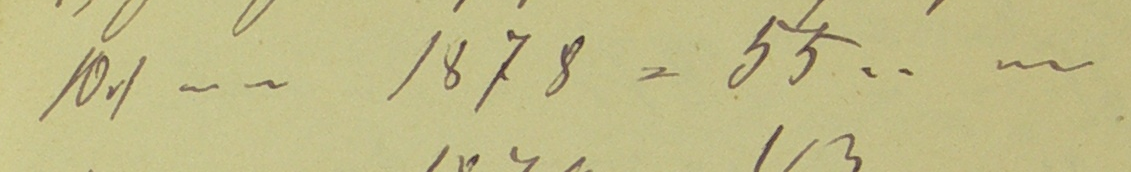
10) * 1878 = 55
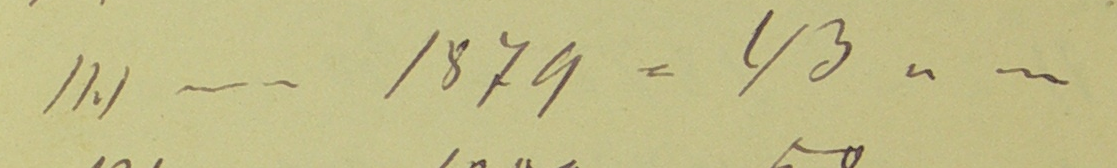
11) * 1879 = 43
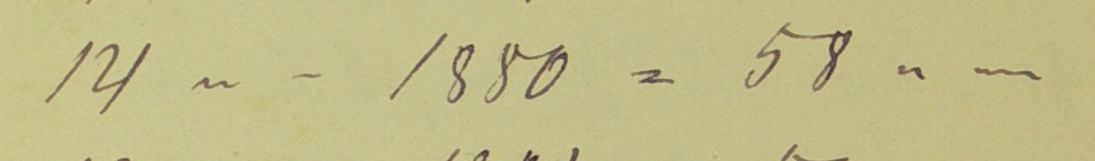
12) * 1880 = 58
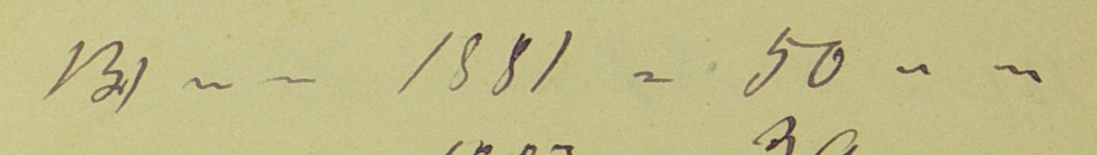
13) * 1881 = 50
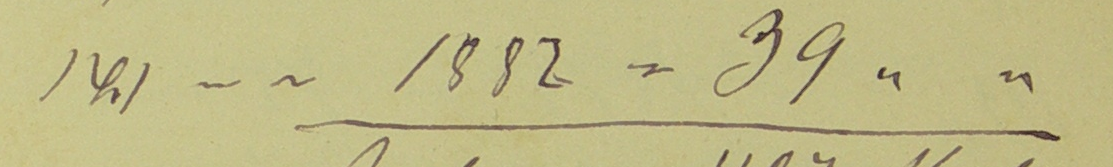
14) * 1882 = 39
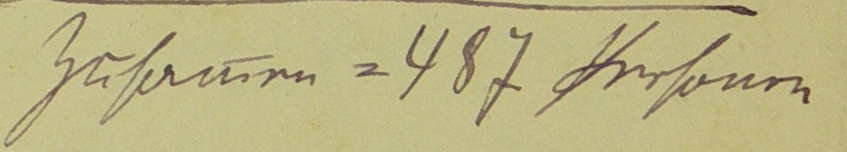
Zusammen = 487 Personen
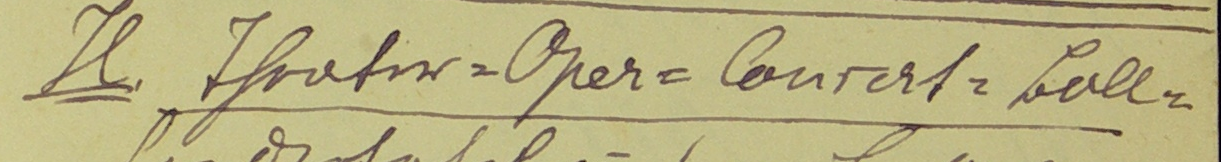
H. ) Theater-Oper-Concert-
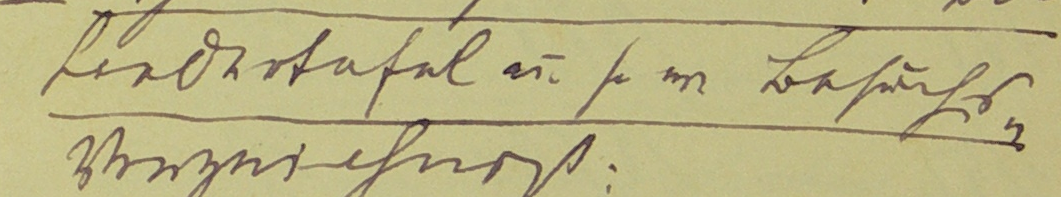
Liedertafel u.s.w. Besuche,
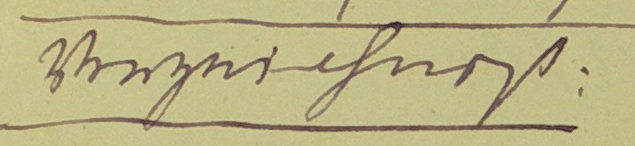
Verzeichniß :
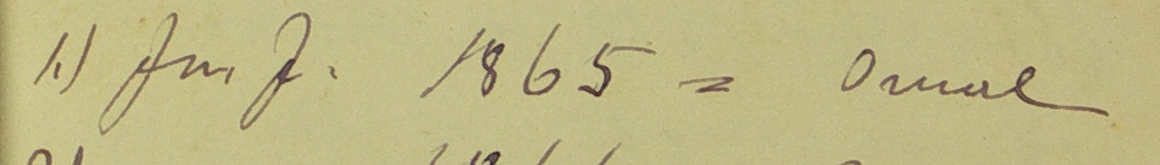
1) Im Jahr 1865 = 0 mal
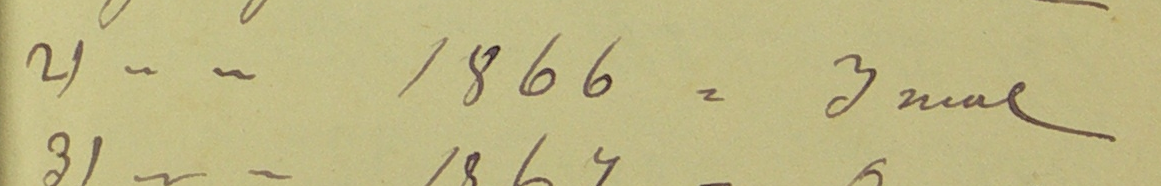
2) * 1866 = 3 mal
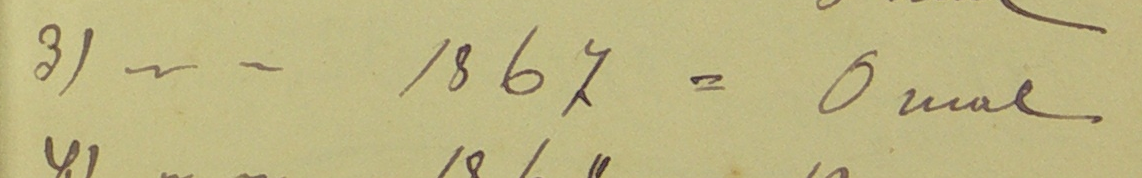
3) * 1867 = 0 mal
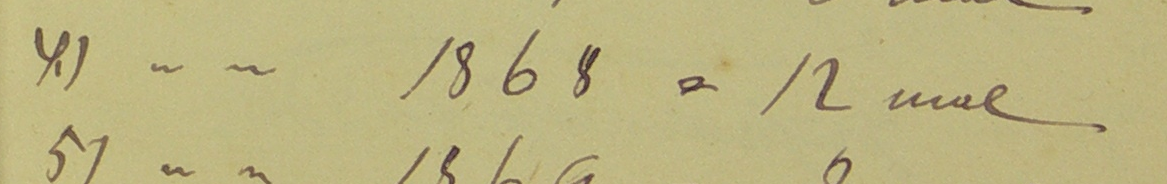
4) * 1868 = 12 mal
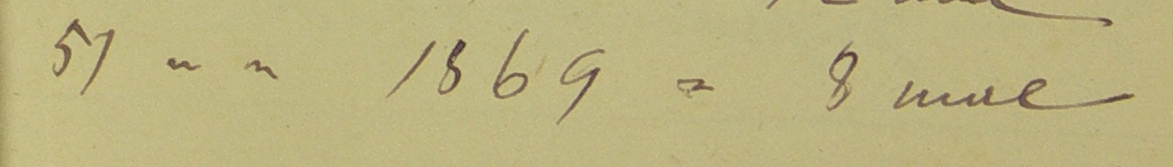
5) * 1869 = 8 mal
